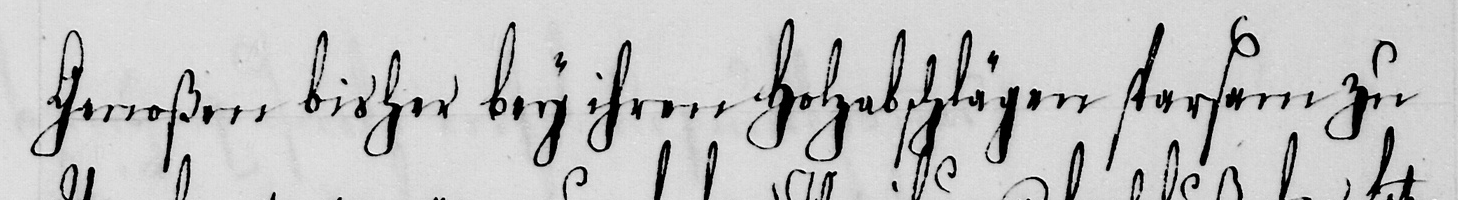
Genoßen bisher bey ihren Holzabschlägen sparsam zu
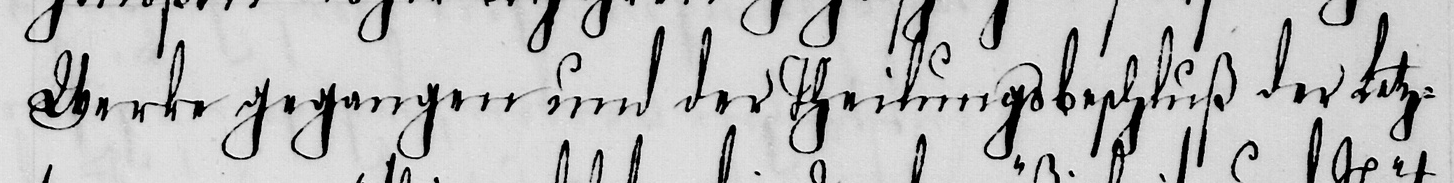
Werke gegangen und der Theilungsbeschluß der Letz¬
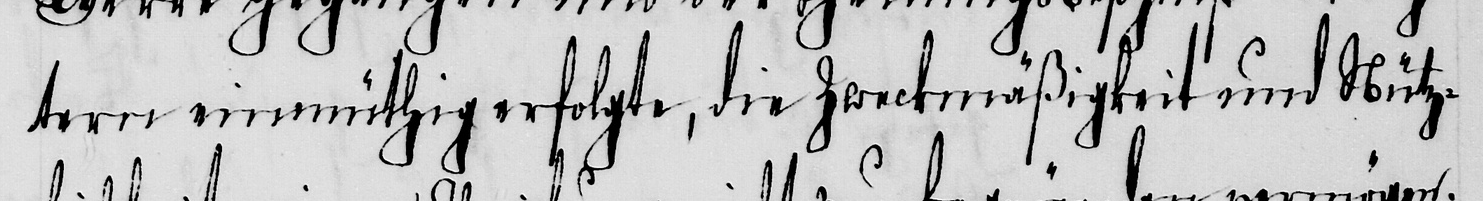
tern einmüthig erfolgte, die Zweckmäßigkeit und Nütz¬
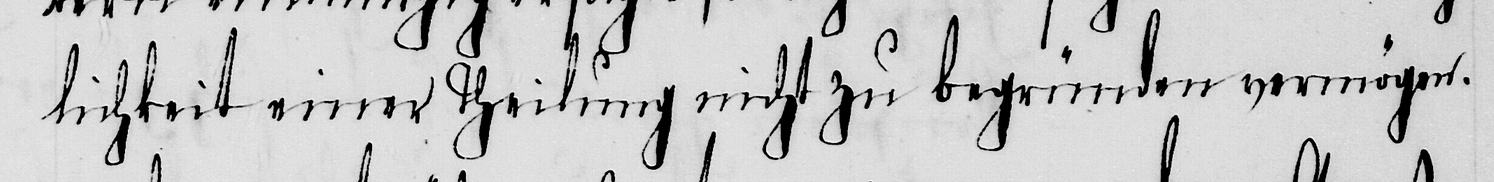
lichkeit einer Theilung nicht zu begründen vermögen.
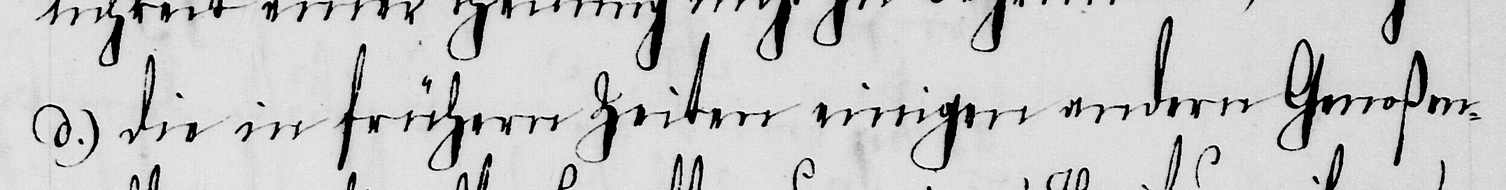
d.) die in frühern Zeiten einigen andern Genoßen¬
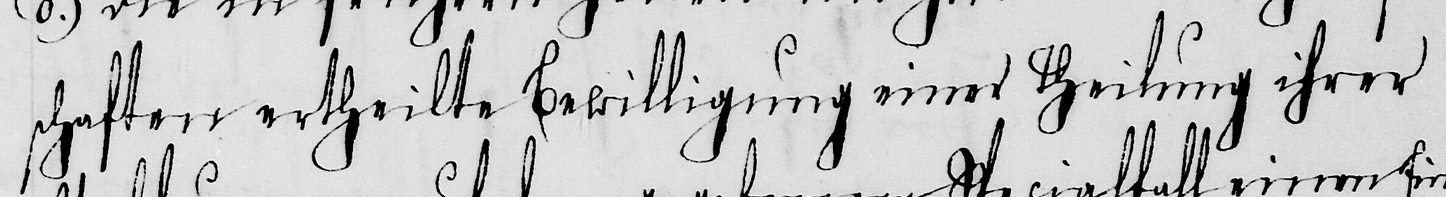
schaften ertheilte Bewilligung einer Theilung ihrer
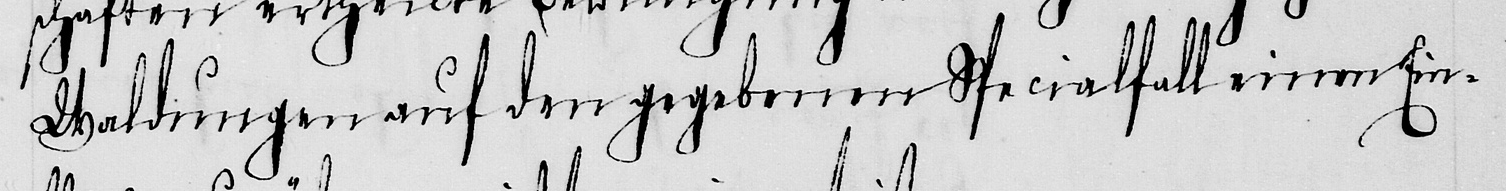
Waldungen auf den gegebenen Specialfall einen Ein¬
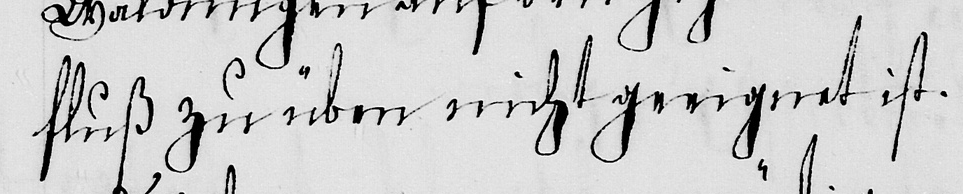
fluß zu üben nicht geeignet ist.
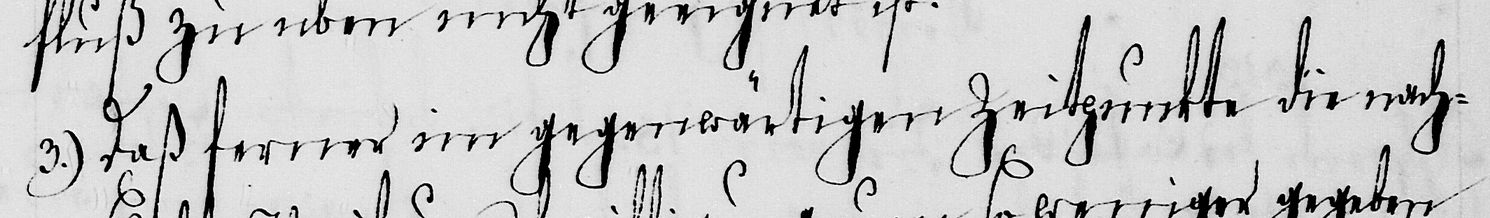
3.) Daß ferner im gegenwärtigen Zeitpunkte die nach¬
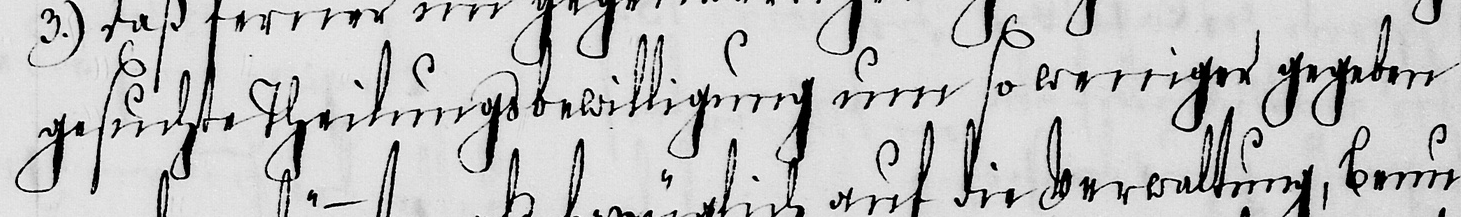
gesuchte Theilungsbewilligung um so weniger gegeben
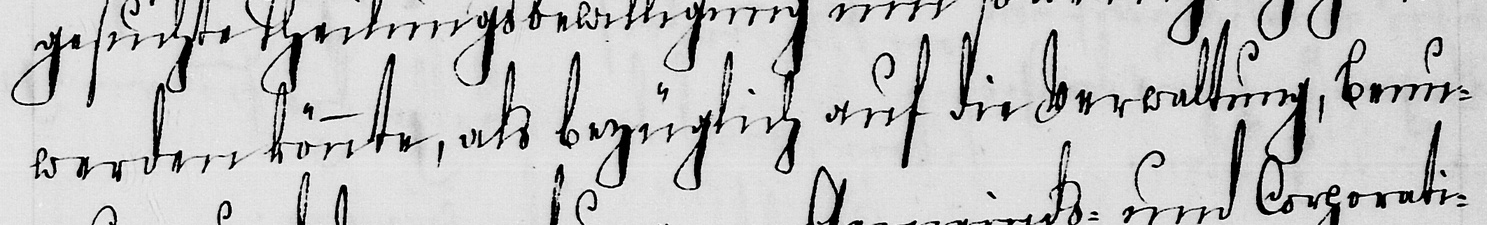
werden könnte, als bezüglich auf die Verwaltung, Benu¬
